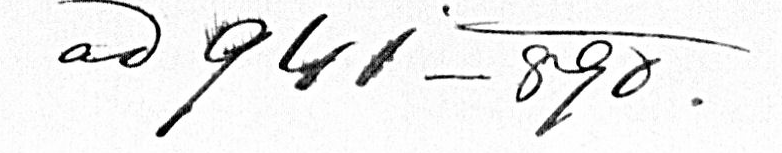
ad 941-890.
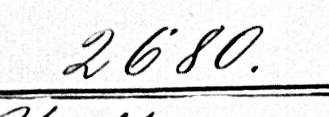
2680.
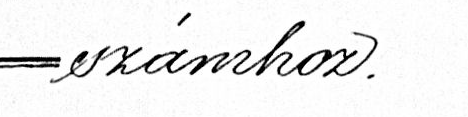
exámhoz.
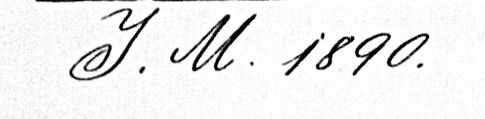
J.M. 1890.
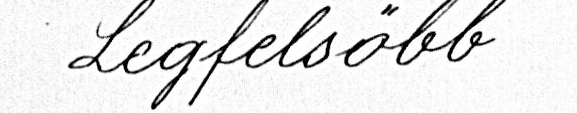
Legfelsöbb
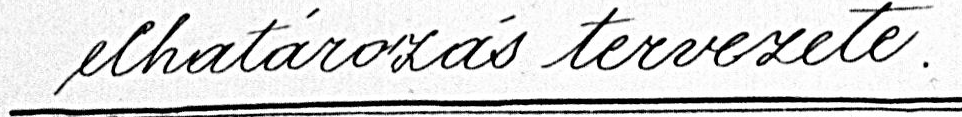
elhatározás tervezete.
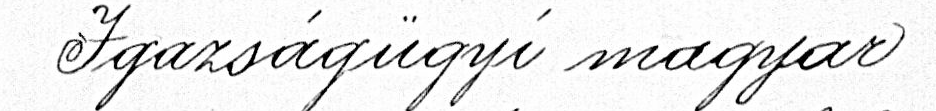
Igazságügyi magyar
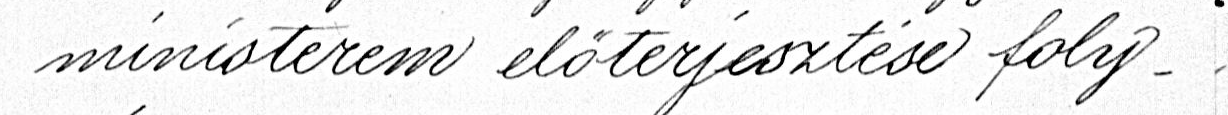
ministerem elöterjesztése foly¬
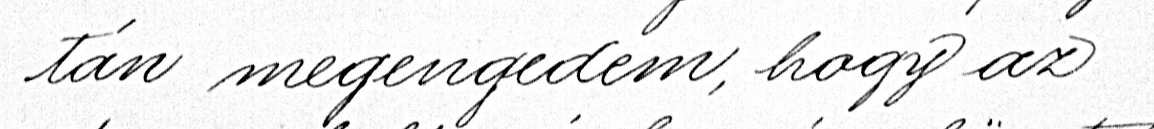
tán megengedem, hogy az
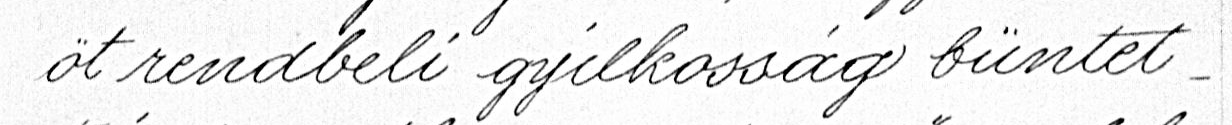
öt rendbeli gyclkosság büntet¬
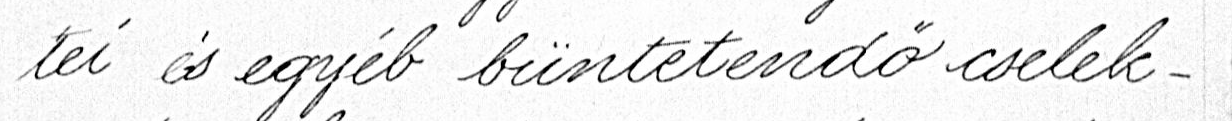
tei és egyéb büntetendö cselek¬
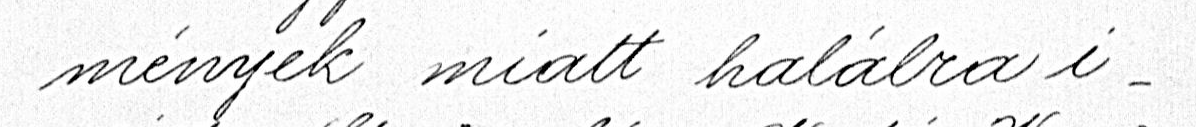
mények miatt halálra i¬
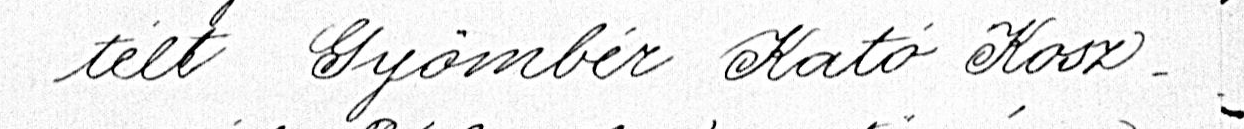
télt Gyömbér Kató Kosz¬
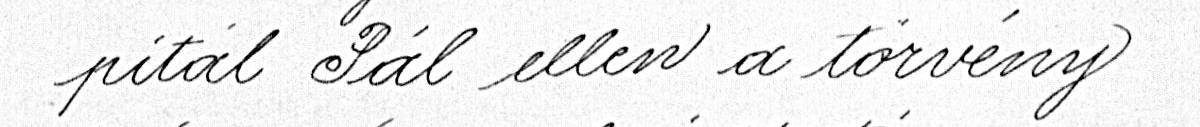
pitál Pál ellen a törvény¬
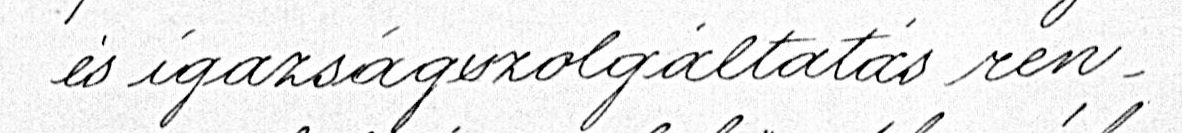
és igazsáquzolgáltatás ren¬
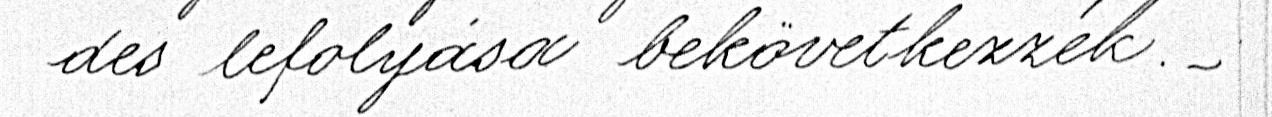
des lefolyása bekövethezzék. -
